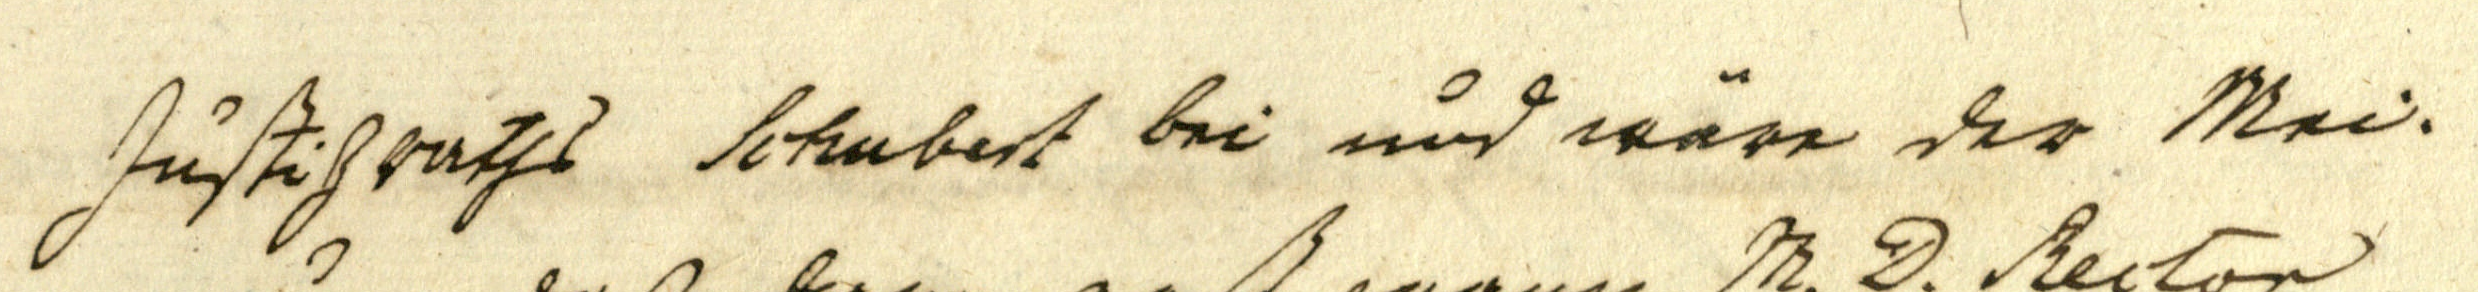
Justiz raths Schubert bei und wäre der Mei¬
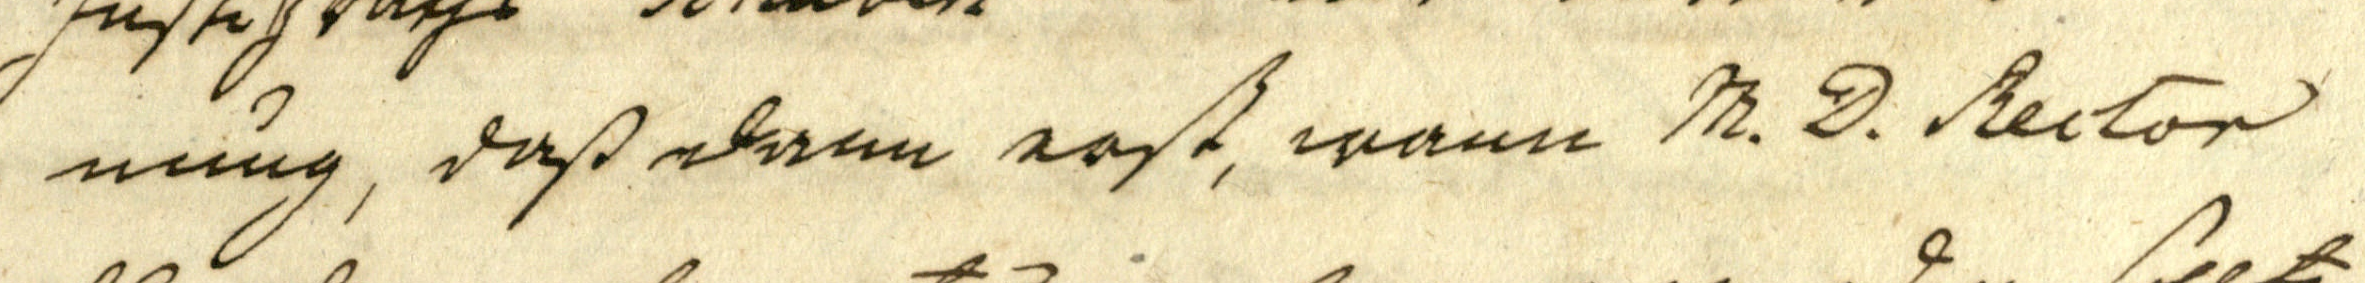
nung, daß dann erst, wann M. D. Rector
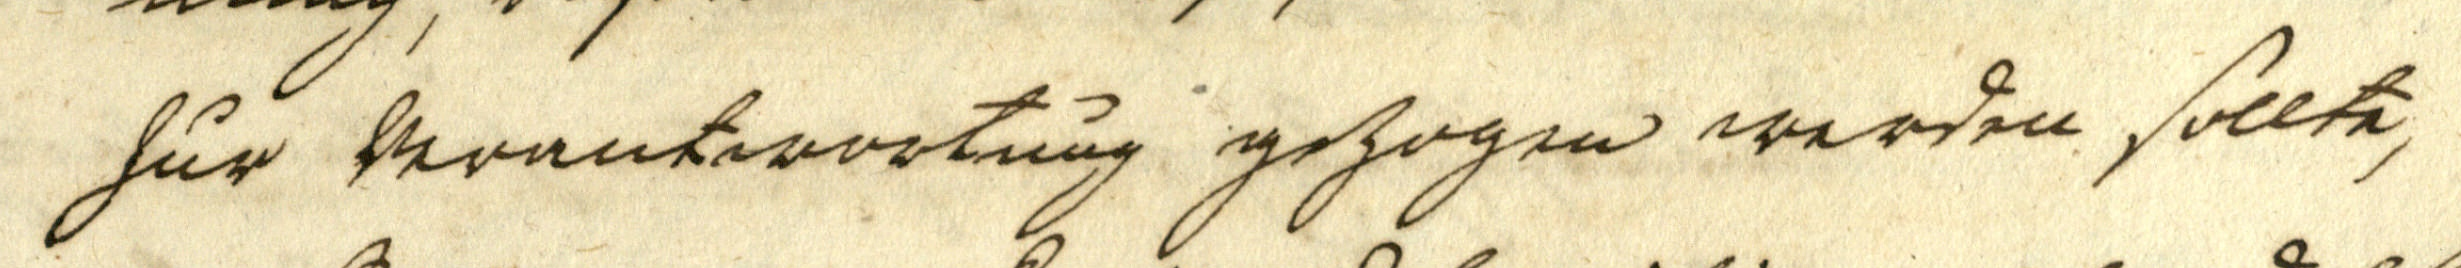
zur Verantwortung gezogen werden sollte,
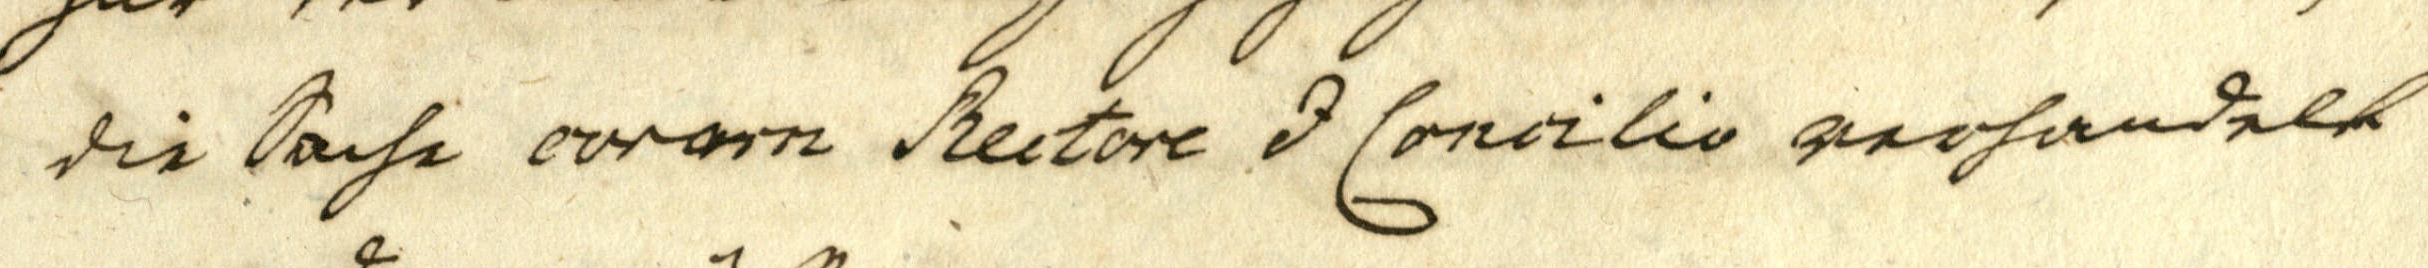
die Sache coram Rectore et Concilio verhandelt
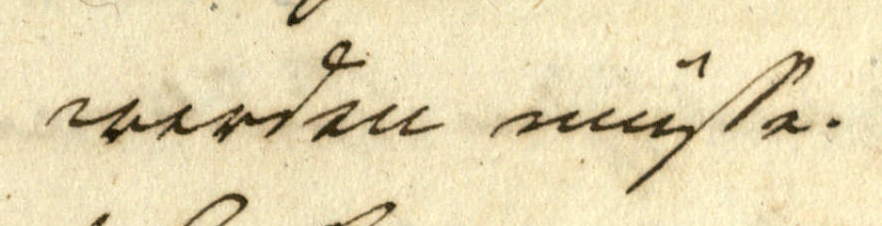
werden müsse.
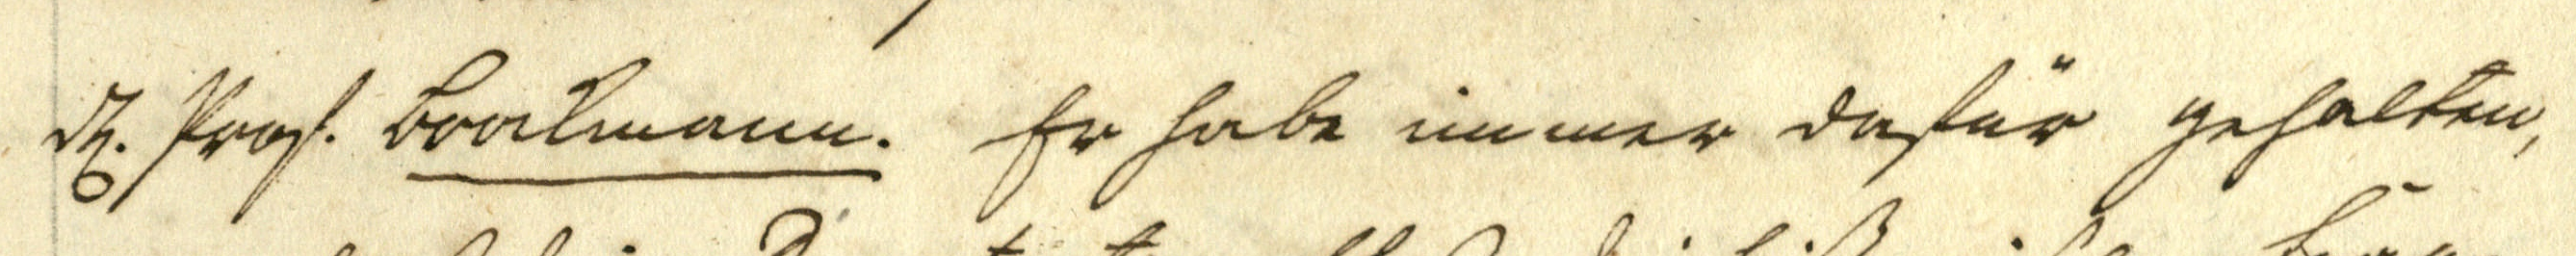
dh. Prof. Brockmann. Er habe immer dafür gehalten,
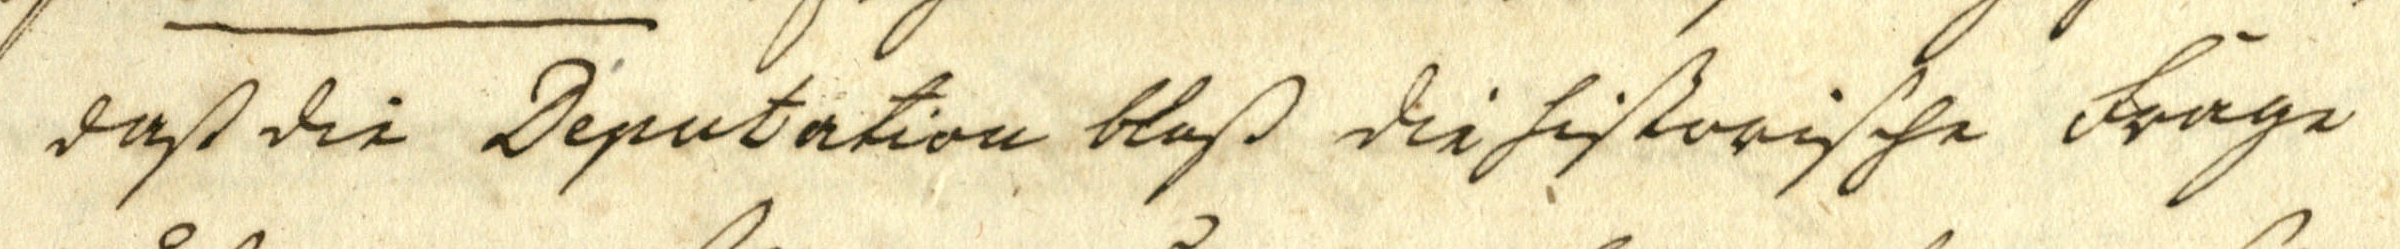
daß die Deputation bloß die historische Frage
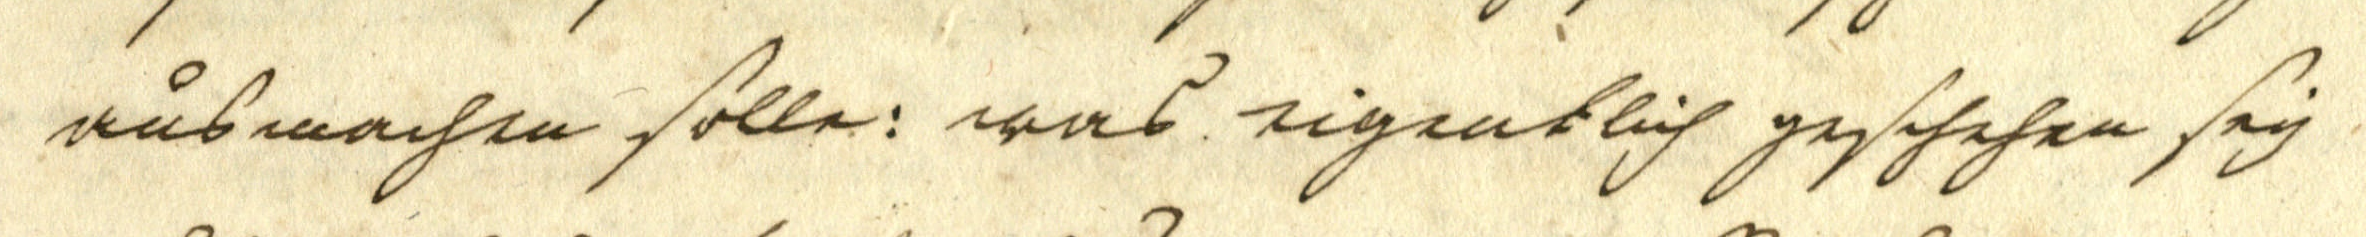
aus machen solle: was eigentlich geschehen seÿ
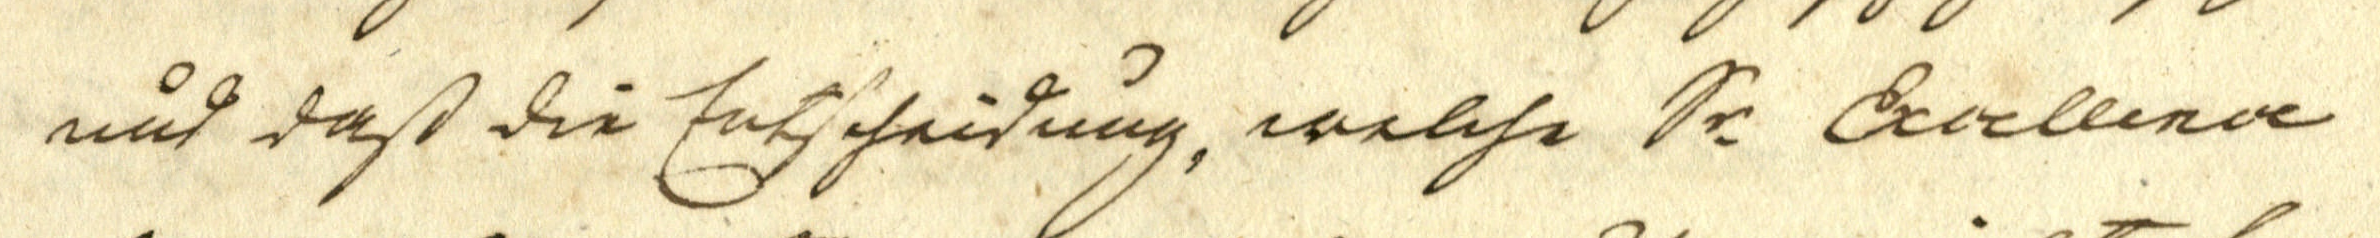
und daß die Entscheidung, welche Sr Excellence
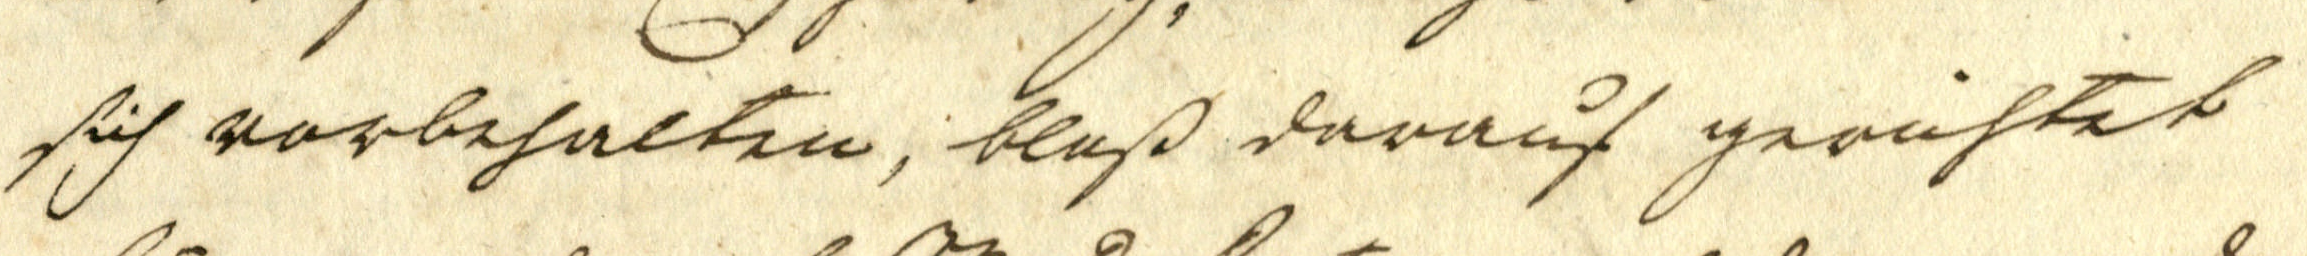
sich vorbehalten, bloß darauf gerichtet
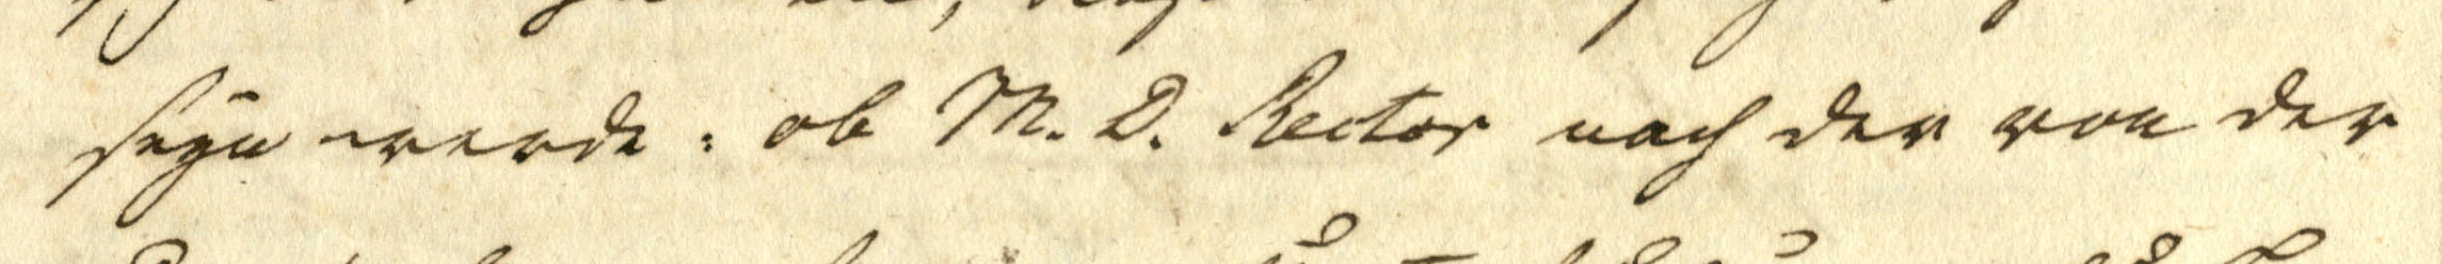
seÿn werde: ob M. D. Rector nach der von der
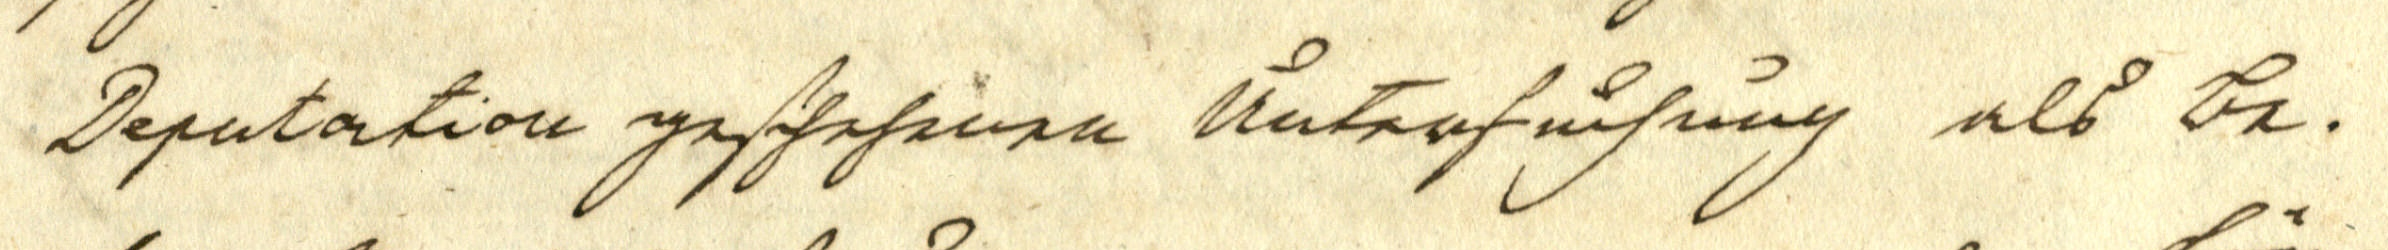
Deputation geschehenen Untersuchung als Be¬
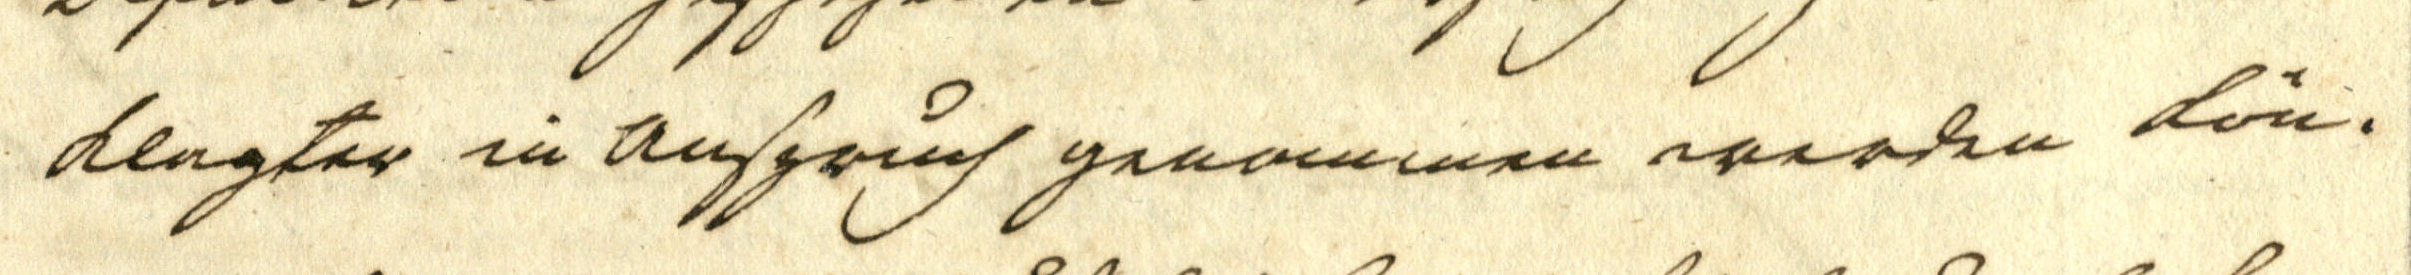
klagter in Anspruch genommen werden kön¬
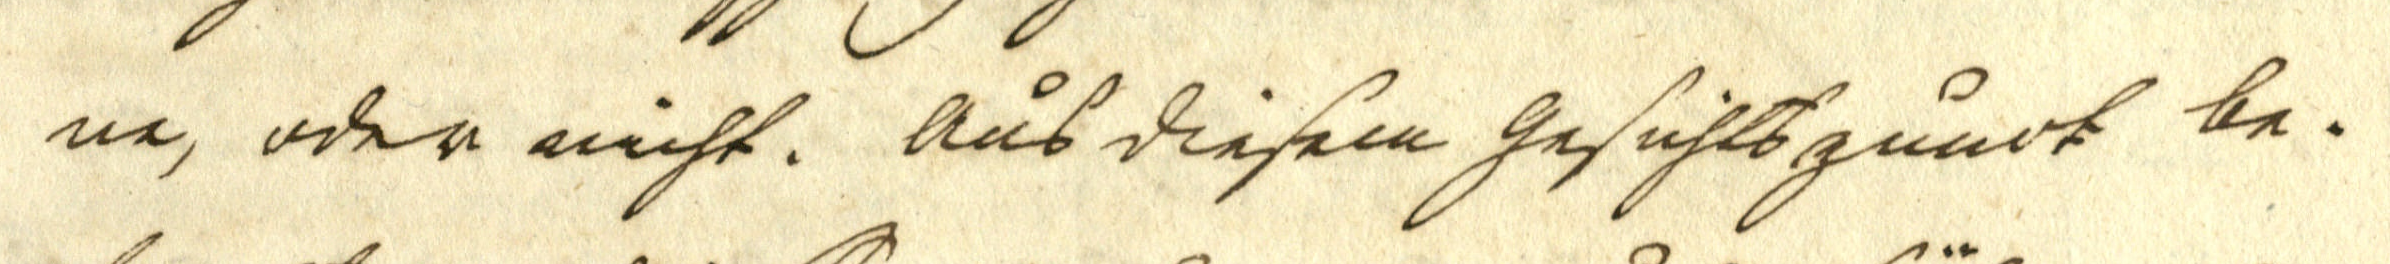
ne, oder nicht. Aus diesem Gesichtspunct be¬
